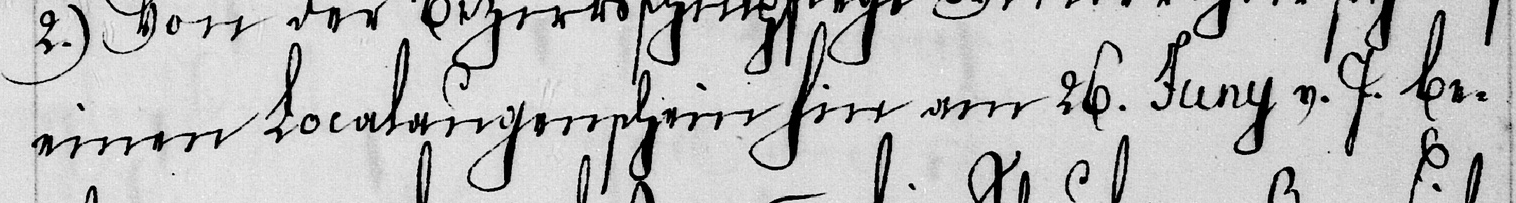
einen Localaugenschein hin am 26. Juny v. J. be¬
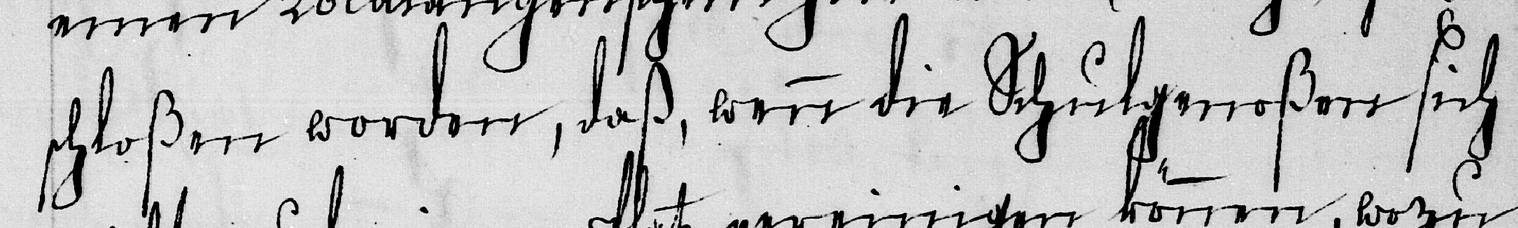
schloßen worden, daß, wenn die Schulgenoßen sich
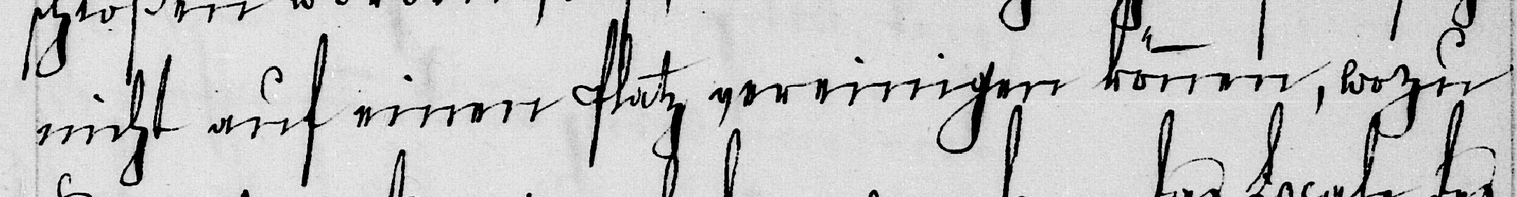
nicht auf einen Platz vereinigen können, wozu
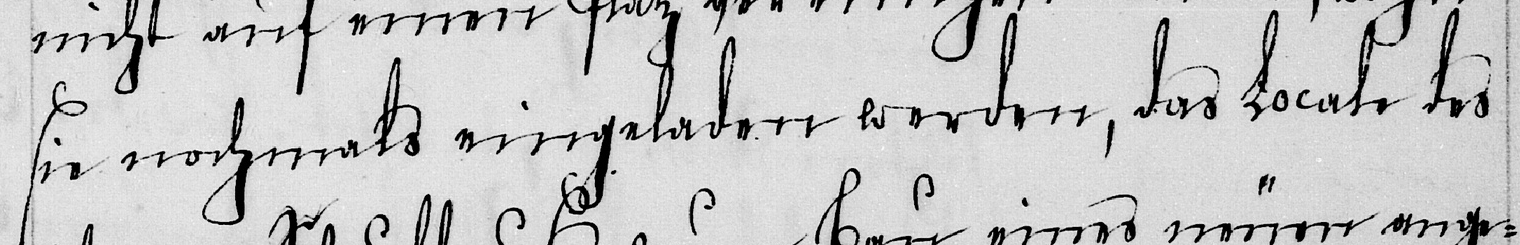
sie nochmals eingeladen werden, das Locale des
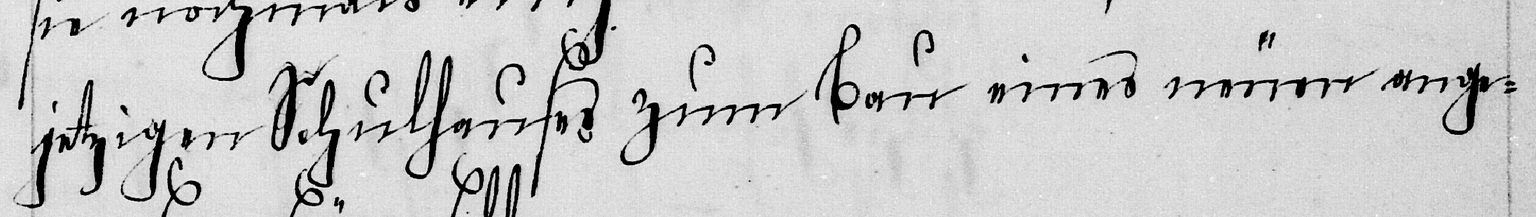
jetzigen Schulhauses zum Bau eines neuen ange¬
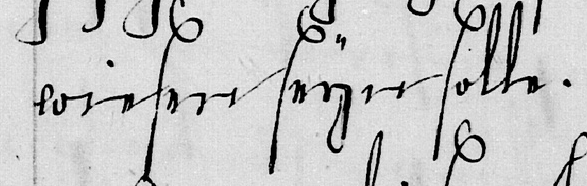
wiesen seyn solle.
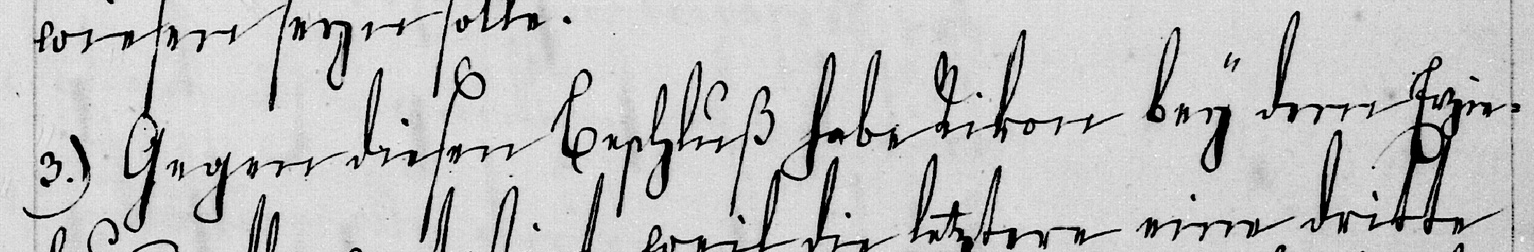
3.) Gegen diesen Beschluß habe Rikon bey dem Erzie¬
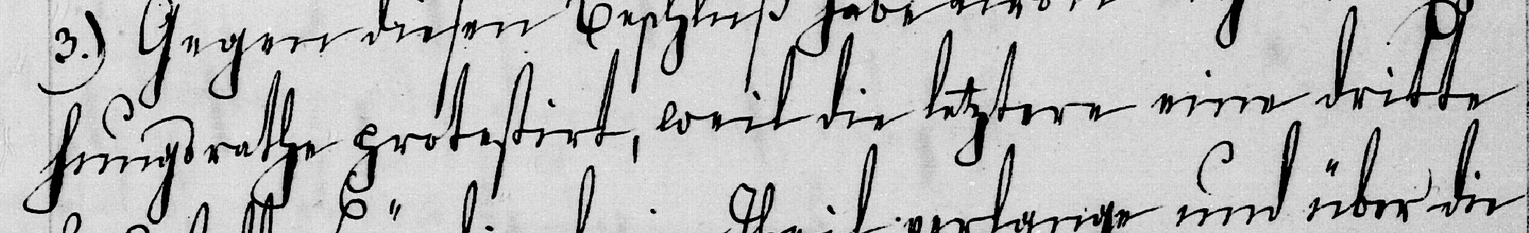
hungsrathe protestirt, weil die letztere eine dritte
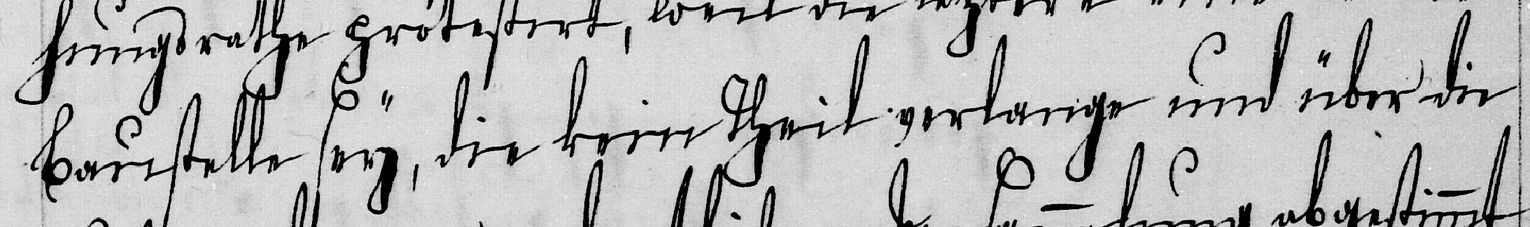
Baustelle sey, die kein Theil verlange und über die
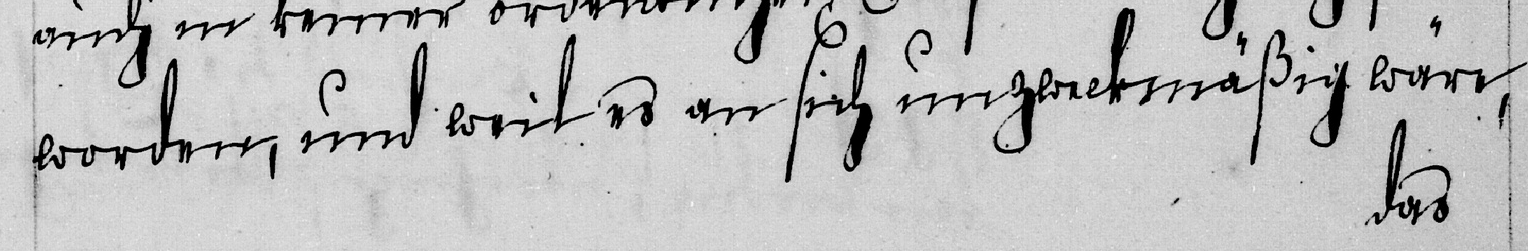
worden, und weil es an sich unzweckmäßig wäre,
